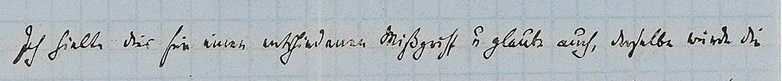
Ich hielte dies für einen entschiedenen Mißgriff u. glaube auch, derselbe würde die
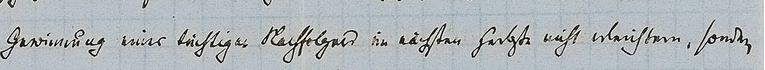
Gewinnung eines tüchtigen Nachfolgers im nächsten Herbste nicht erleichtern, sondern
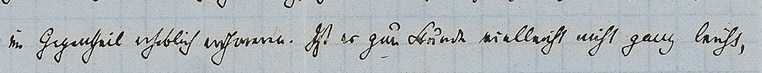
im Gegentheil erheblich erschweren. Ist es zur Stunde vielleicht nicht ganz leicht,
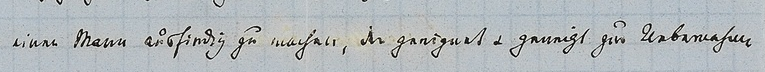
einen Mann ausfindig zu machen, der geeignet & geneigt zur Uebernahme
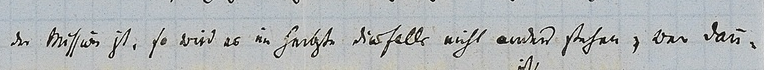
der Mission ist, so wird es im Herbste diesfalls nicht anders stehen, wer dann-
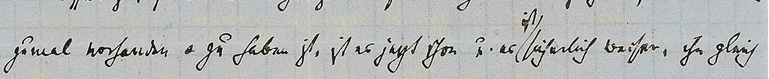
zumal vorhanden & zu haben ist, ist es jetzt schon u. es ist sicherlich weiser, ihn gleich
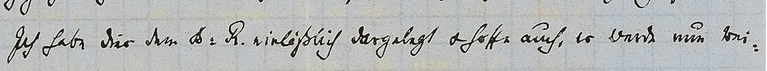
Ich habe dies dem B-R. einläßlich dargelegt & hoffe auch, es werde nun wei-
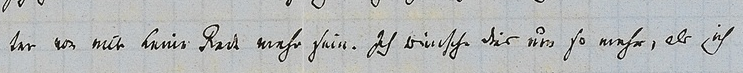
ter von mir keine Rede mehr sein. Ich wünsche dies um so mehr, als ich
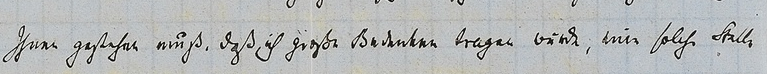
Ihnen gestehen muß, daß ich große Bedenken tragen würde, eine solche Stelle
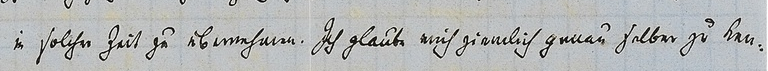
in solcher Zeit zu übernehmen. Ich glaube mich ziemlich genau selber zu ken-
